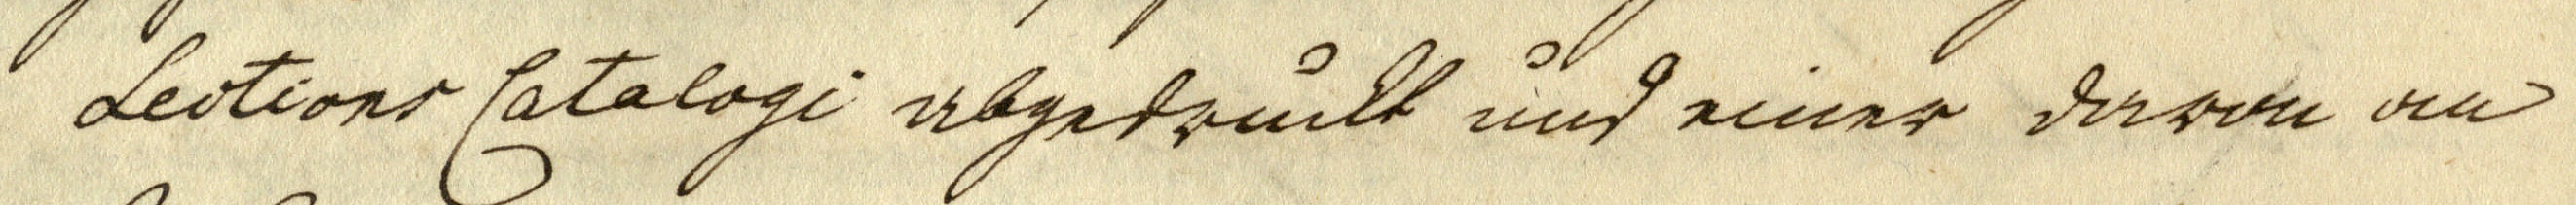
Lections Catalogi abgedruckt und einer davon an
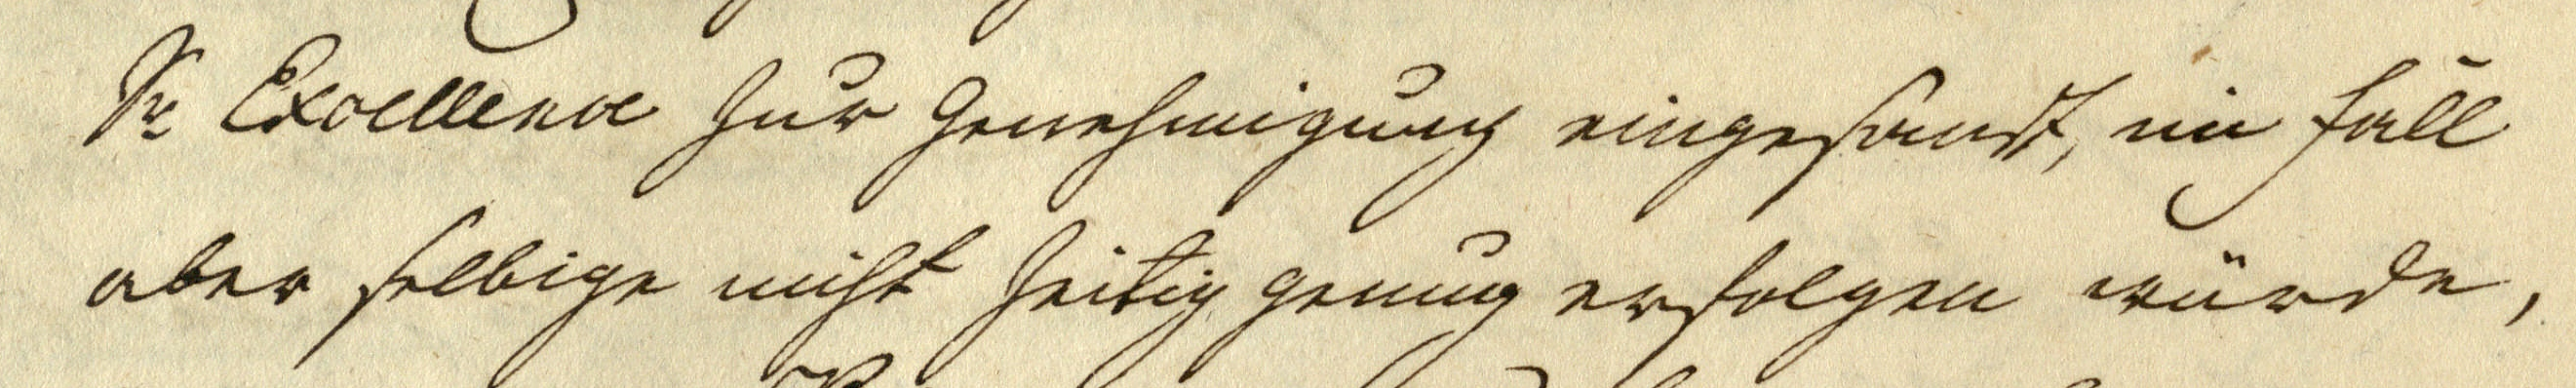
Sr. Excellence zur Genehmigung eingesandt, im Fall
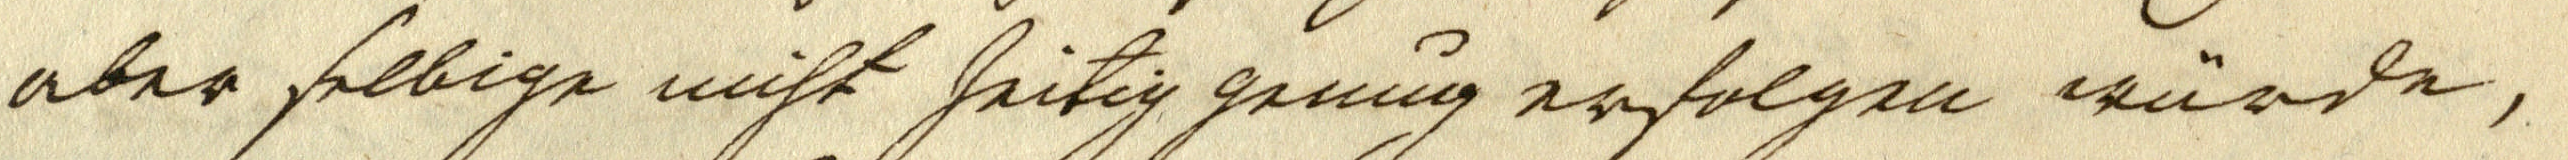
aber selbige nicht zeitig genug erfolgen würde,
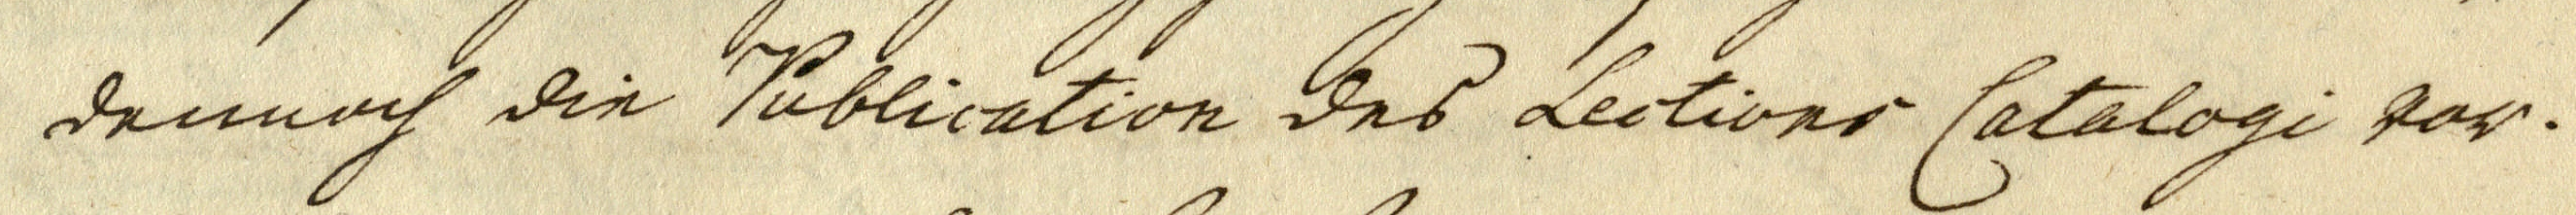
dennoch die Publication des Lections Catalogi vor-
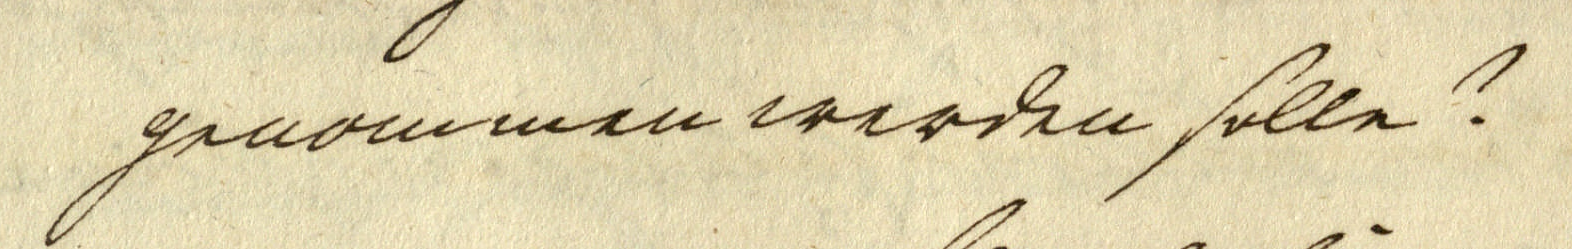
genommen werden solle?
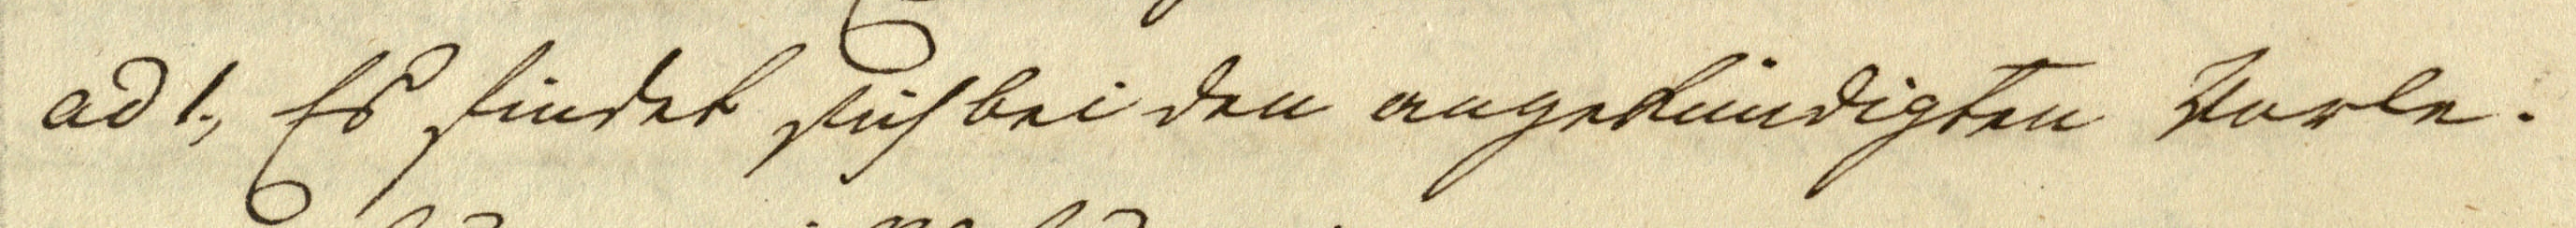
Ad 1, Es findet sich bei den angekündigten Vorlesungen
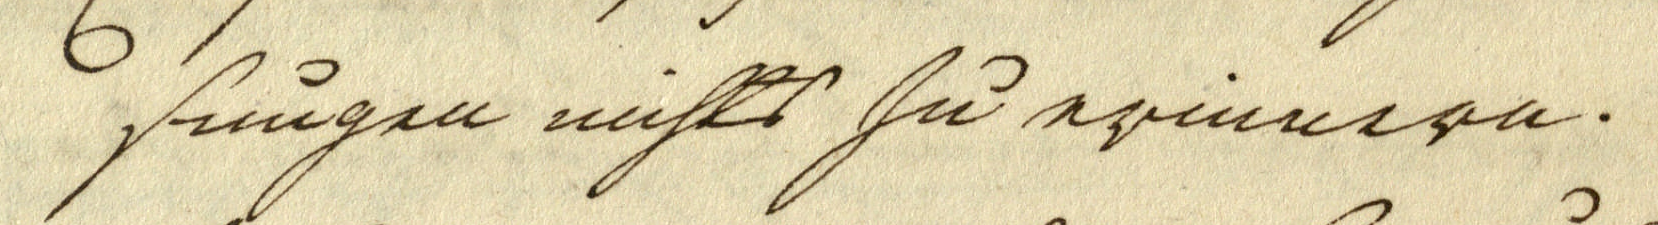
nichts zu erinnern.
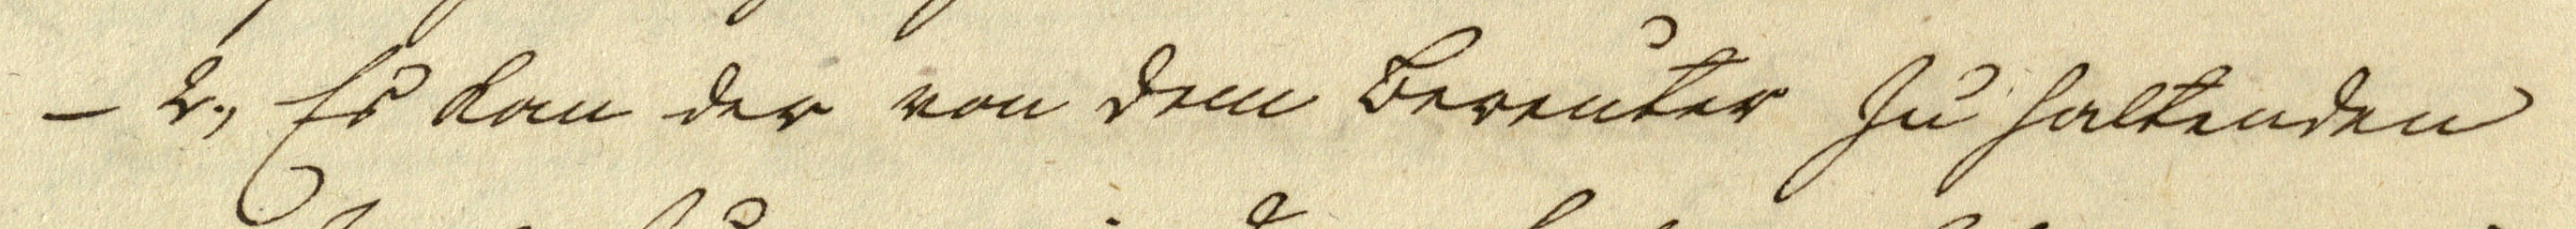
- 2., Es kan der von dem Bereuter zu haltenden
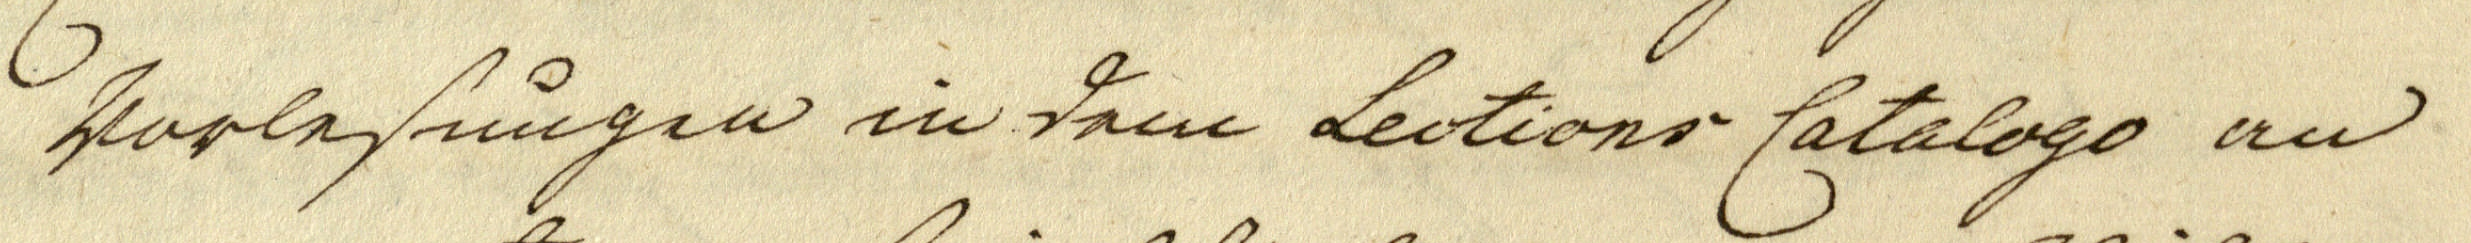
Vorlesungen in dem Lections Catalogo an
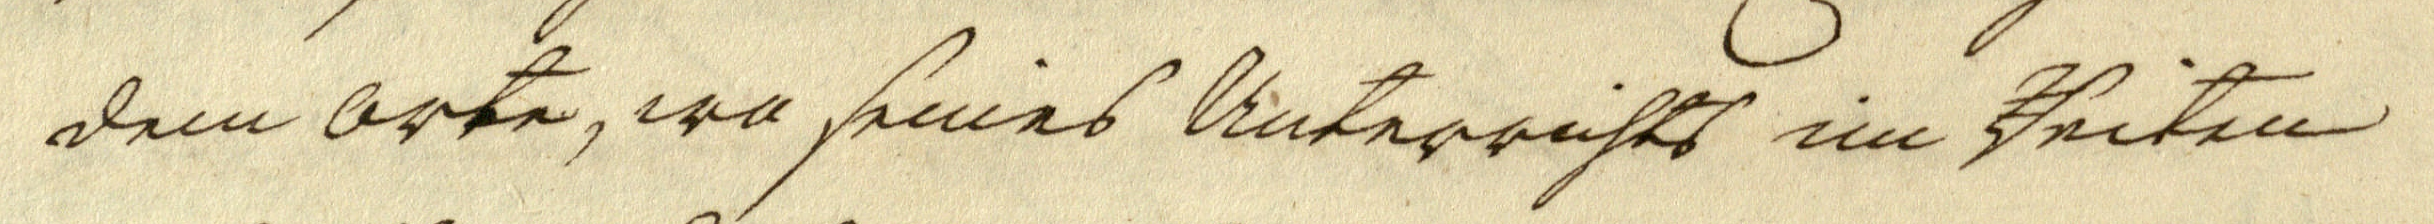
dem Orte, wo seines Unterrichts im Reiten
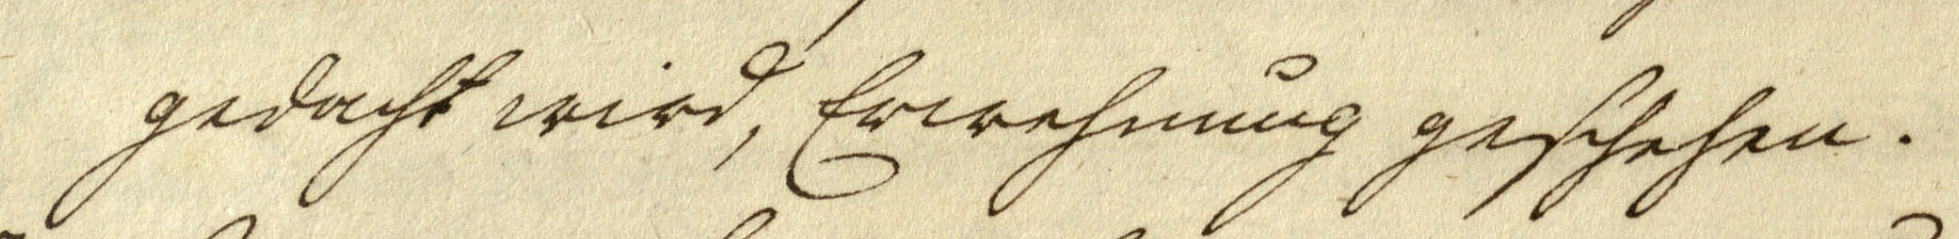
gedacht wird, Erwehnung geschehen.
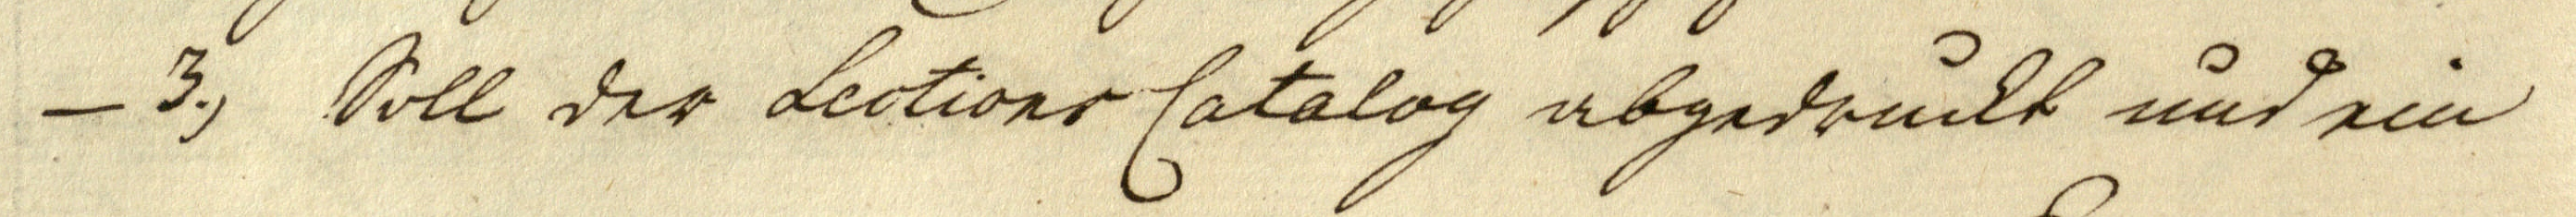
- 3., Soll der Lections Catalog abgedruckt und ein
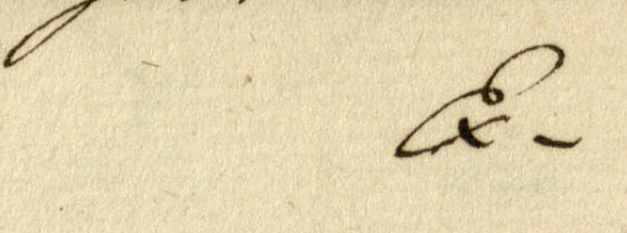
Ex-
